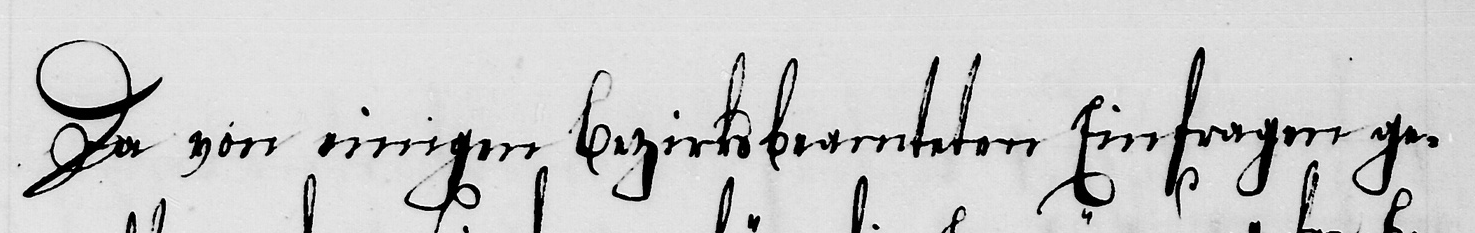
Da von einigen Bezirksbeamteten Einfragen ge¬
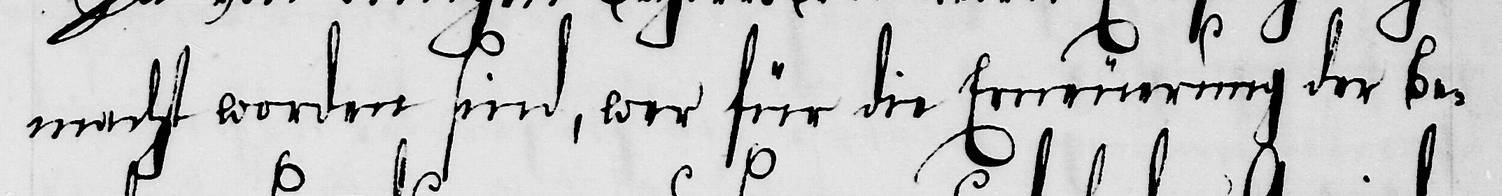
macht worden sind, wer für die Erneuerung der Be¬
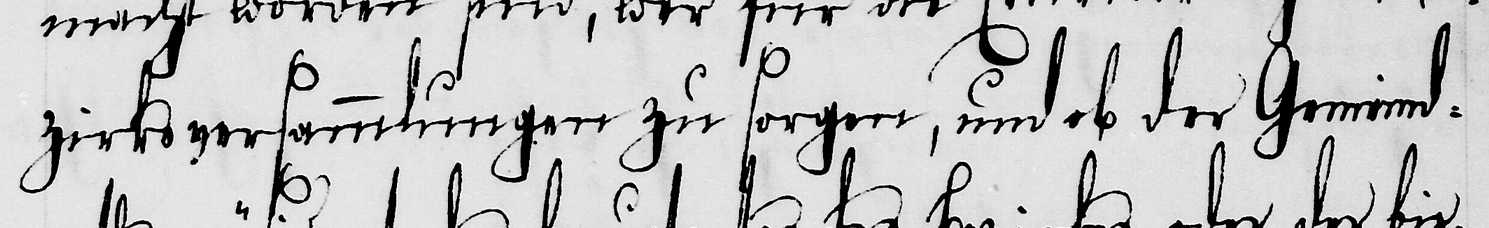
zirksversammlungen zu sorgen, und ob der Gemeind¬
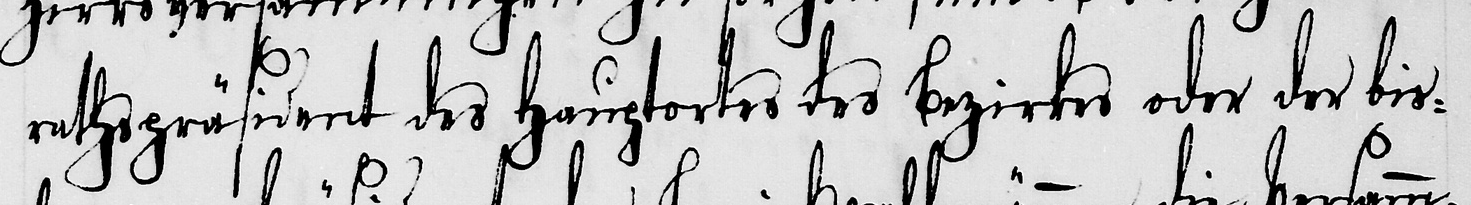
rathspräsident des Hauptortes des Bezirkes oder der bis¬
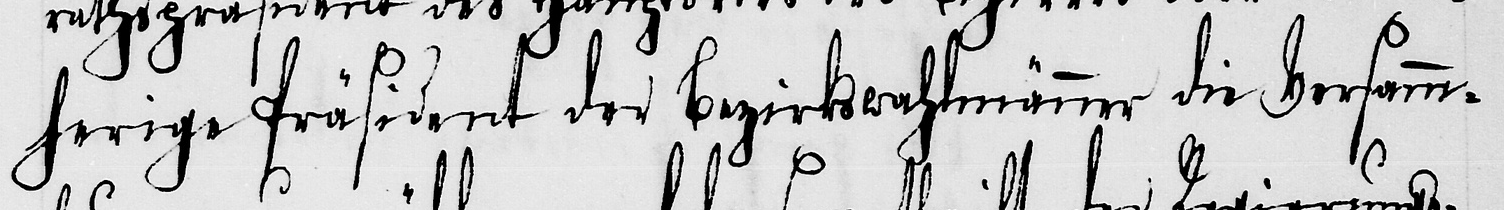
herige Präsident der Bezirkswahlmänner die Versamm¬
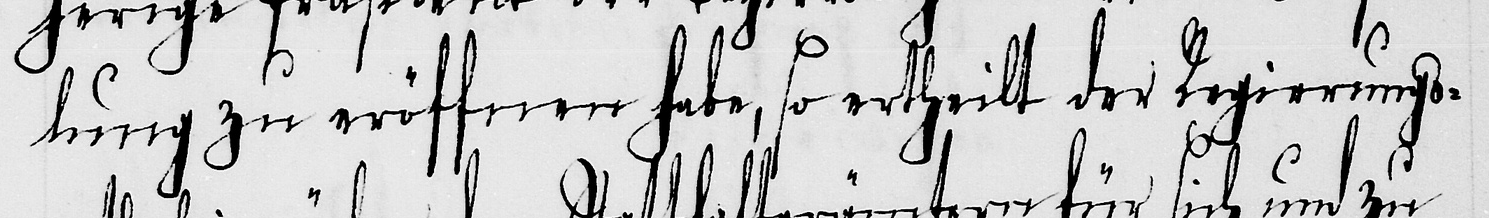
lung zu eröffnen habe, so ertheilt der Regierungs¬
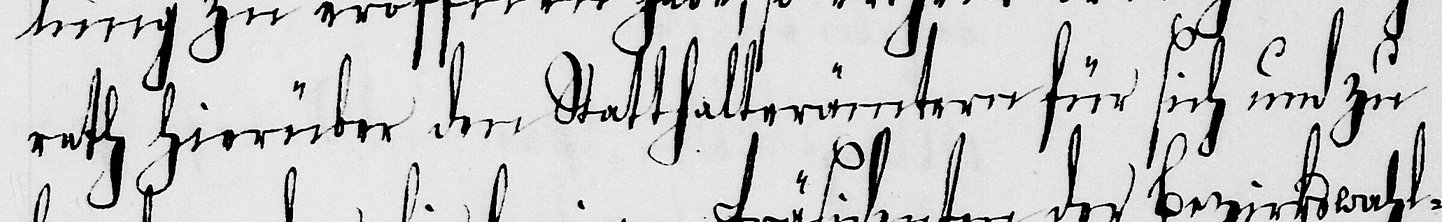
rath hierüber den Statthalterämtern für sich und zu
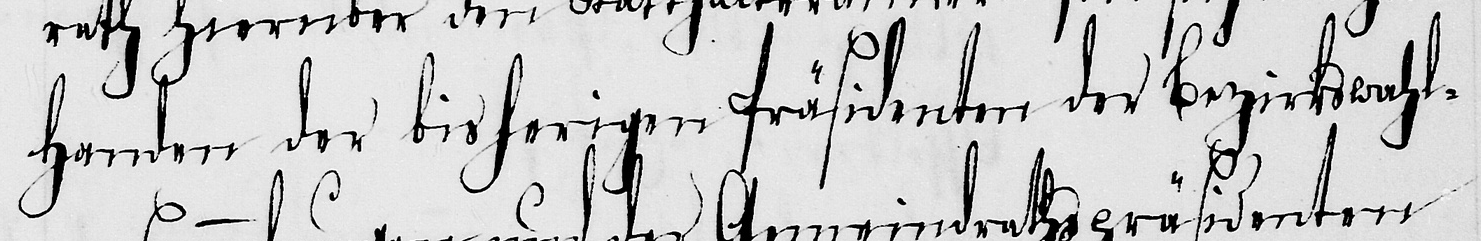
Handen der bisherigen Präsidenten der Bezirkswahl¬
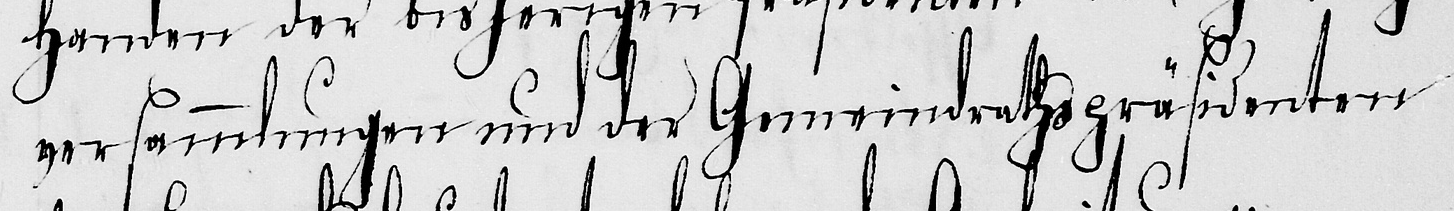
versammlungen und der Gemeindrathspräsidenten
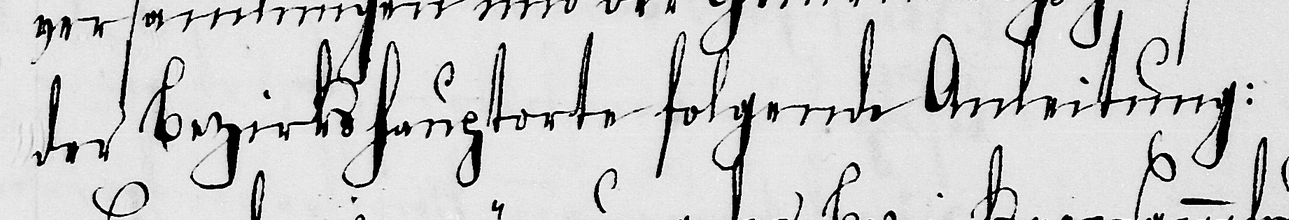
der Bezirkshauptorte folgende Anleitung:
